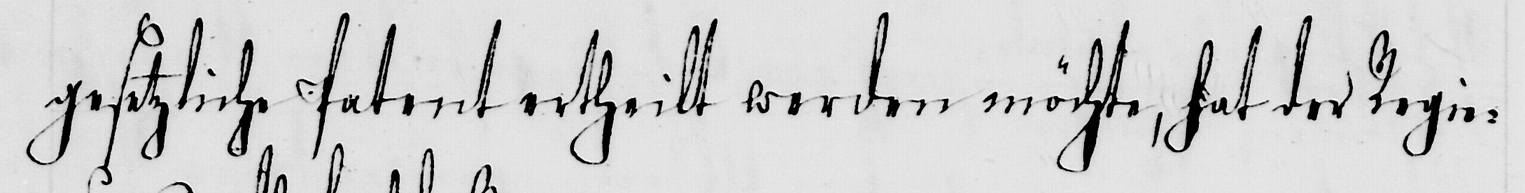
gesetzliche Patent ertheilt werden möchte, hat der Regie¬
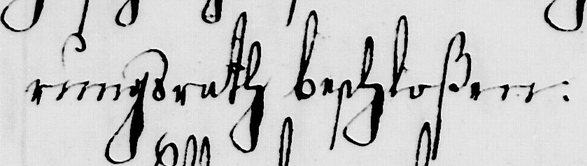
rungsrath beschloßen:
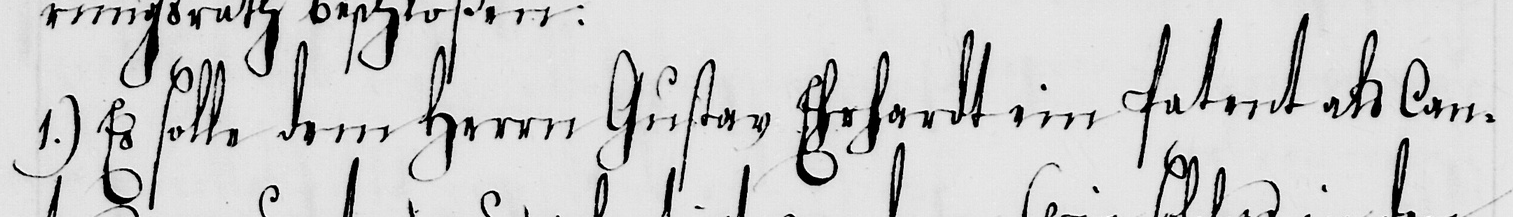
Es solle dem Herrn Gustav Ehrhardt ein Patent als Can¬
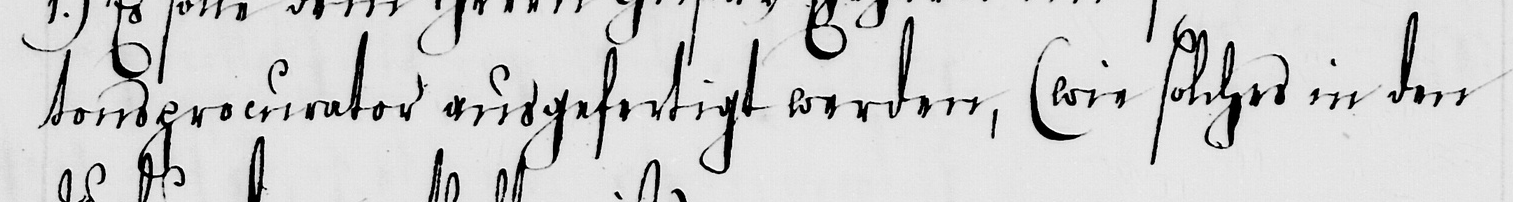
tonsprocurator ausgefertigt werden, (wie solches in den
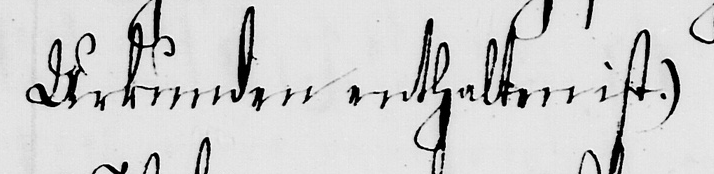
Urkunden enthalten ist.)
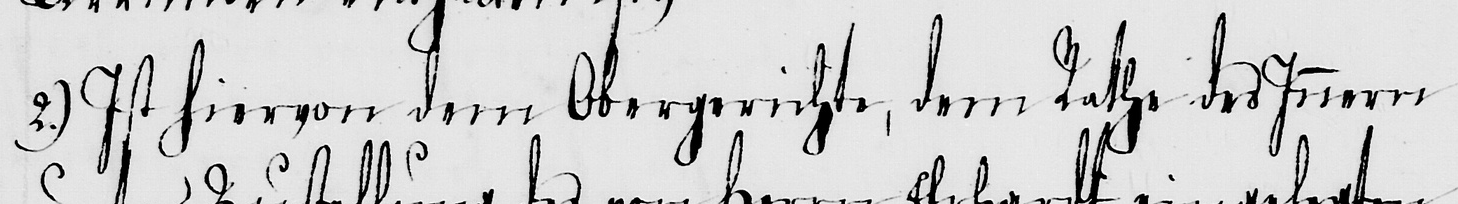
2.) Ist hiervon dem Obergerichte, dem Rathe des Innern
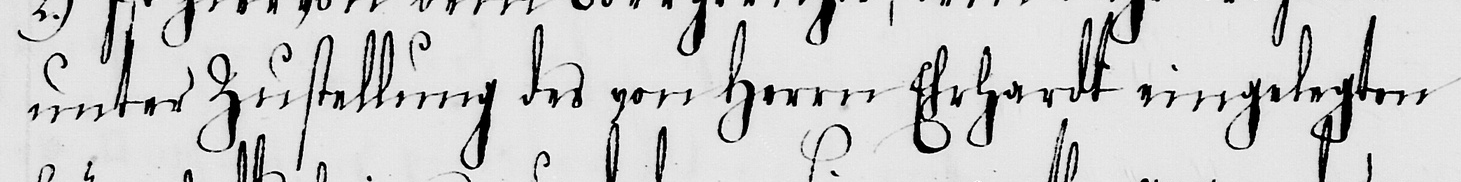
unter Zustellung des von Herrn Ehrhardt eingelegten
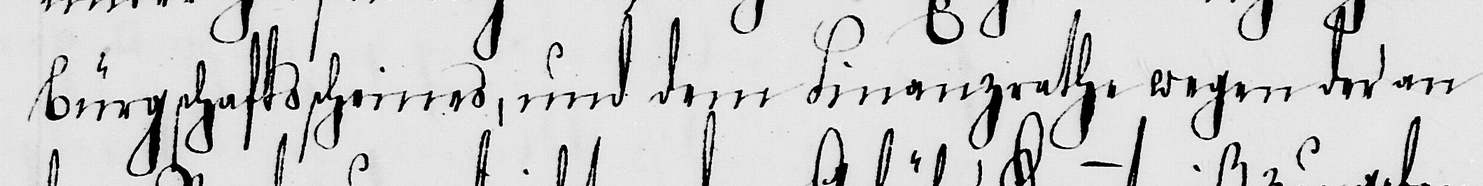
Bürgschaftsscheines, und dem Finanzrathe wegen der an
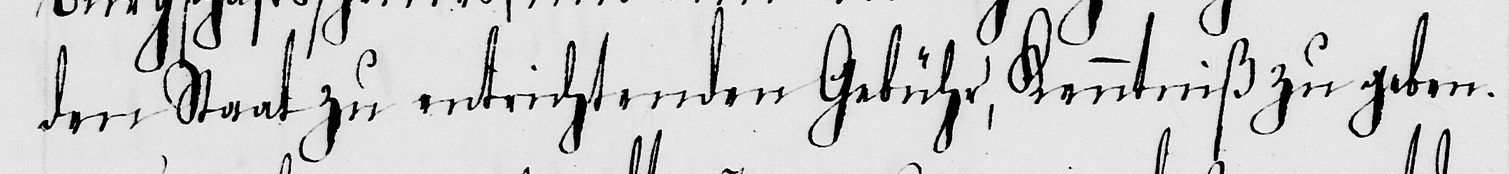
den Staat zu entrichtenden Gebühr, Kenntniß zu geben.
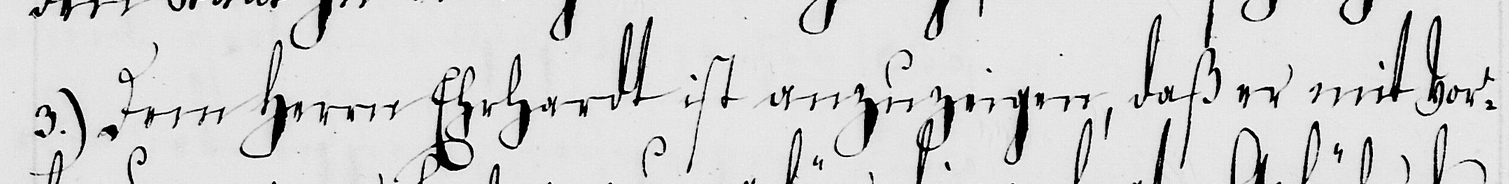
3.) Dem Herrn Ehrhardt ist anzuzeigen, daß er mit Vor¬
